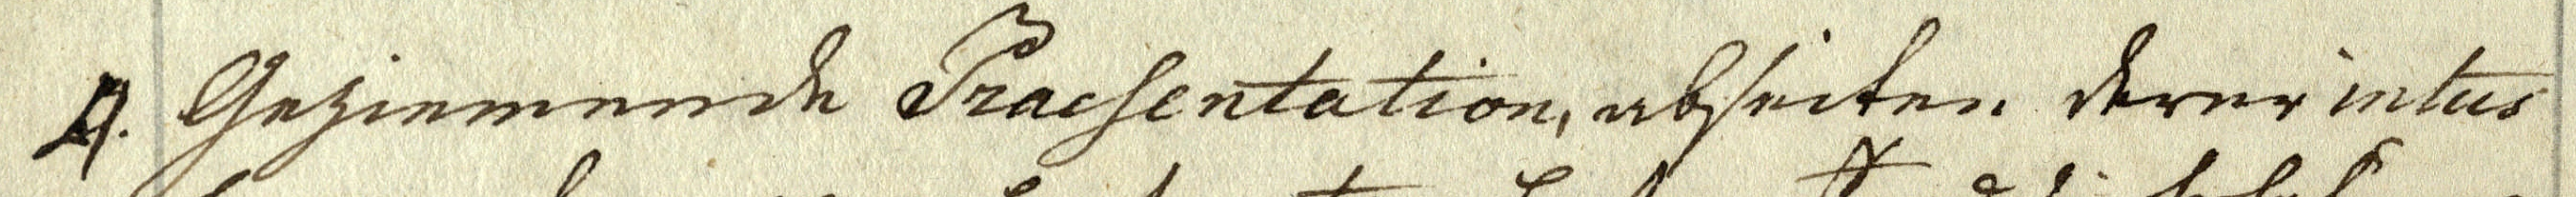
4. Geziemende Praesentation, abseiten derer intus
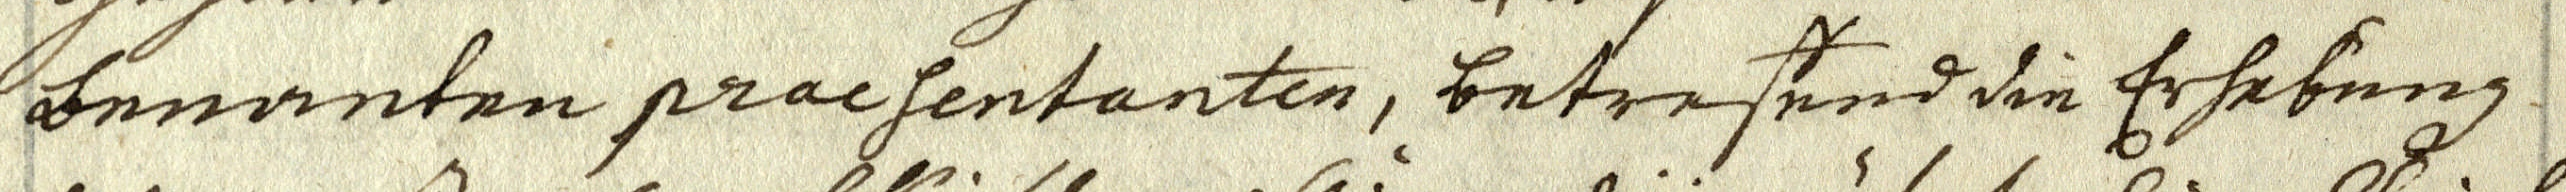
benanten praesentanten, betreffend die Erhebung
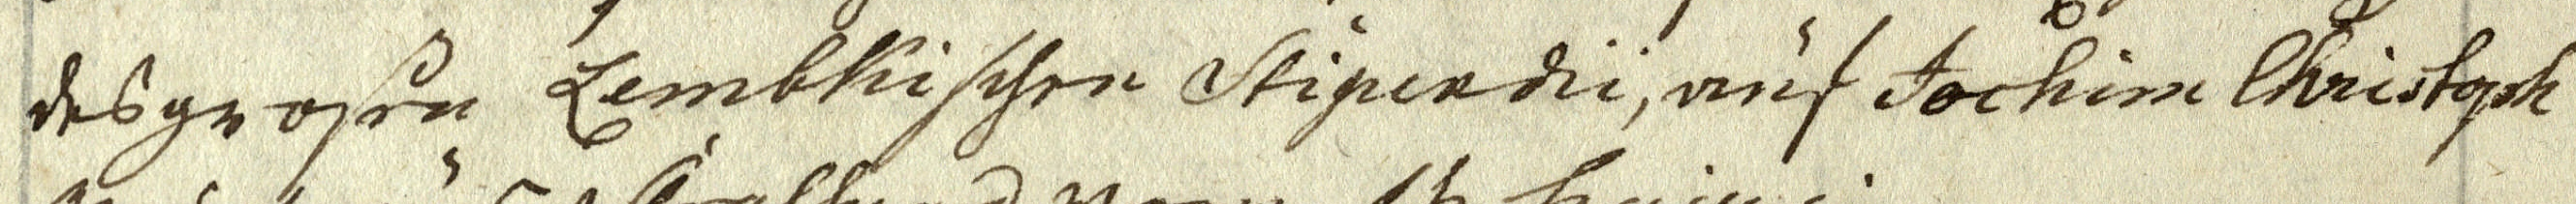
des großen Lembkischen Stipendii, auf Jochim Christoph
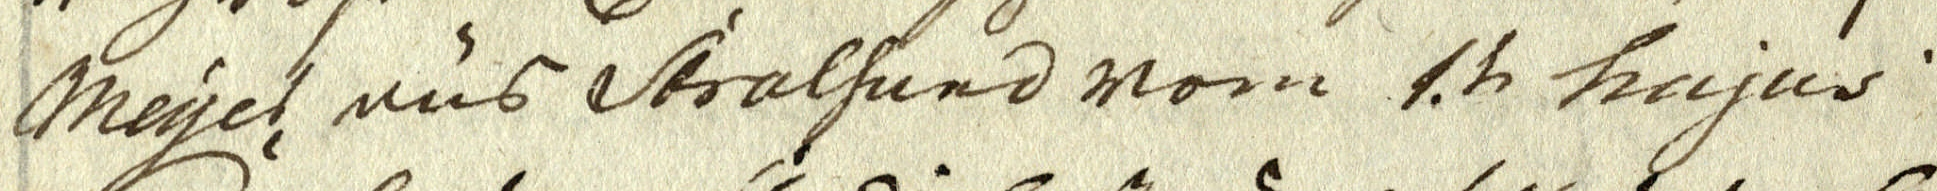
Meÿer aus Stralsund vom 1.t. hujus.
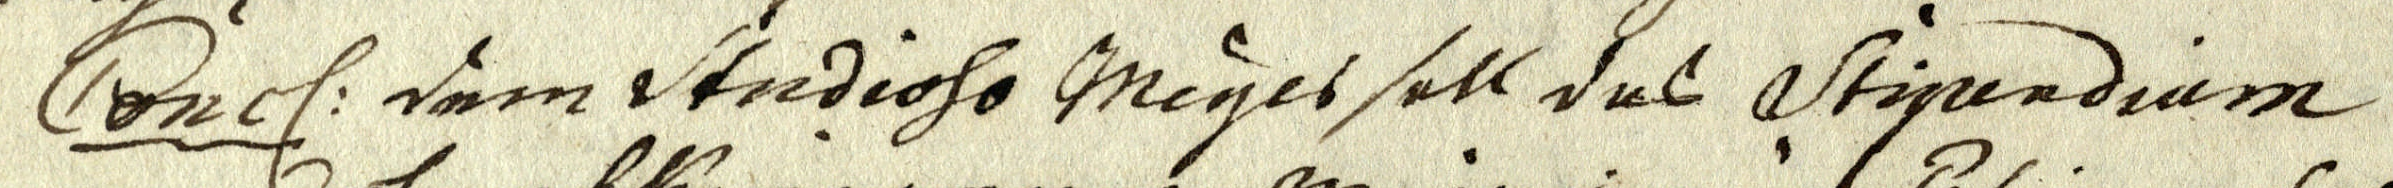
Concl. dem Studioso Meÿer soll das Stipendium
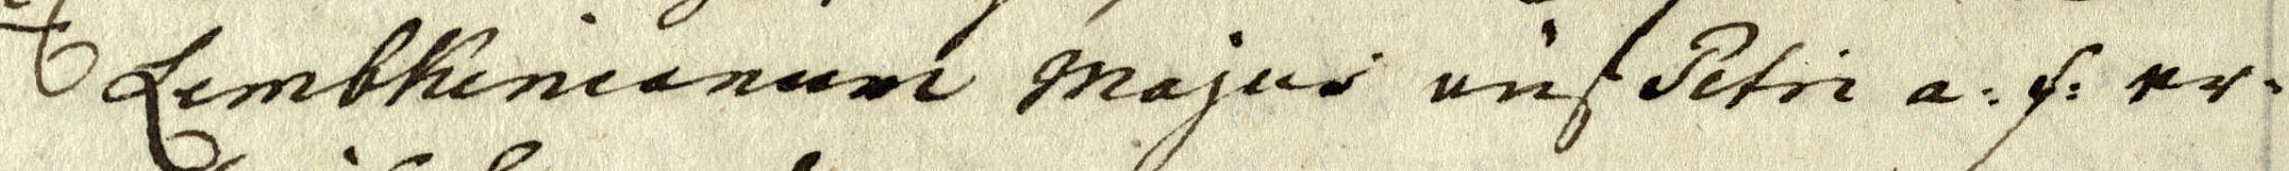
Lembkenianum majus auf Petri a. f. er¬
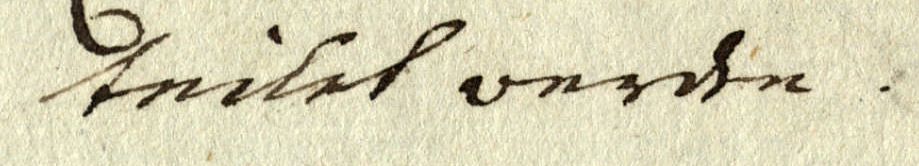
theilet werden.
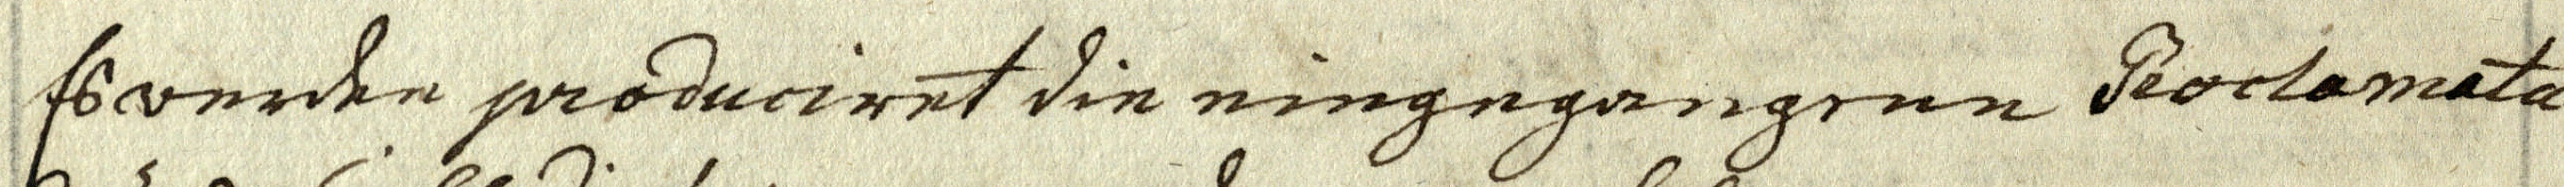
5, Es werden produciret die eingegangene Proclamata
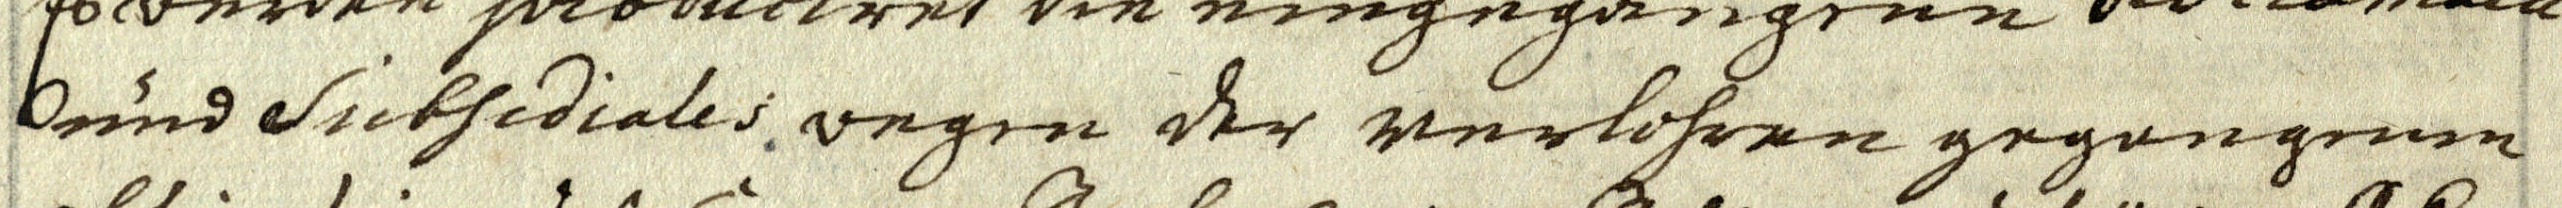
und Subsidiales wegen der verlohren gegangenen
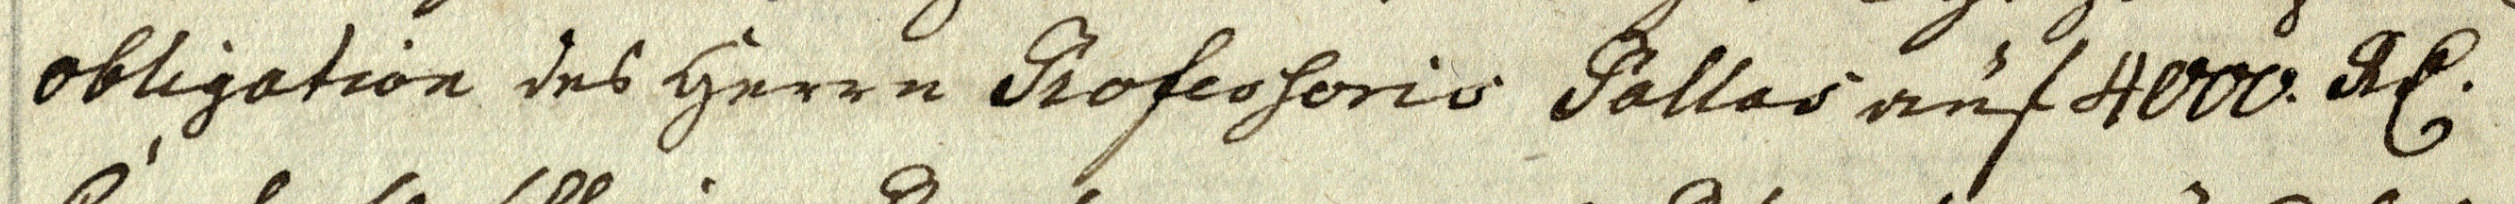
obligation des Herrn Professoris Pallas auf 4000. Rt.
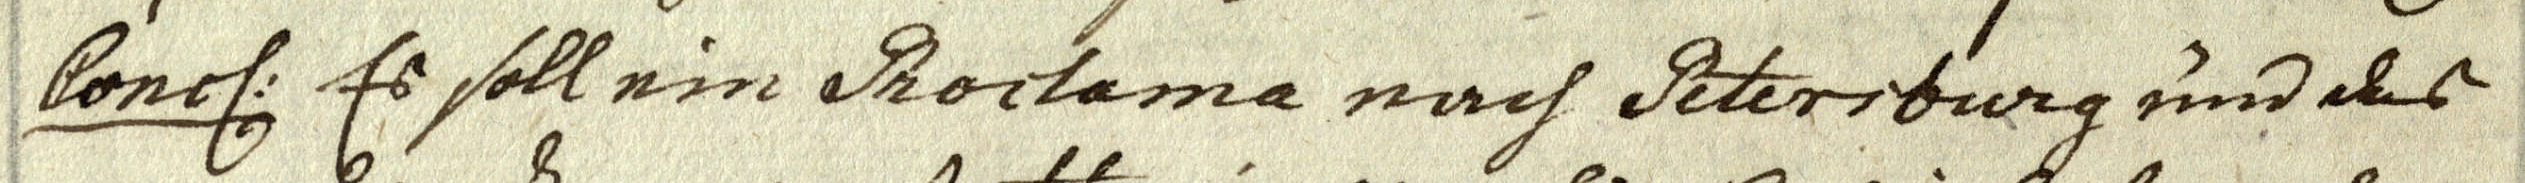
Concl. Es soll ein Proclama nach Petersburg und das
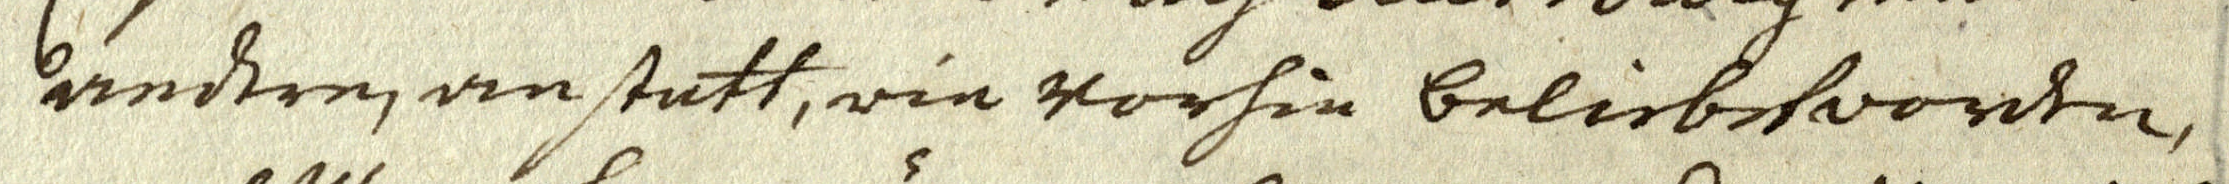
andere, anstatt, wie vorhin beliebet worden,
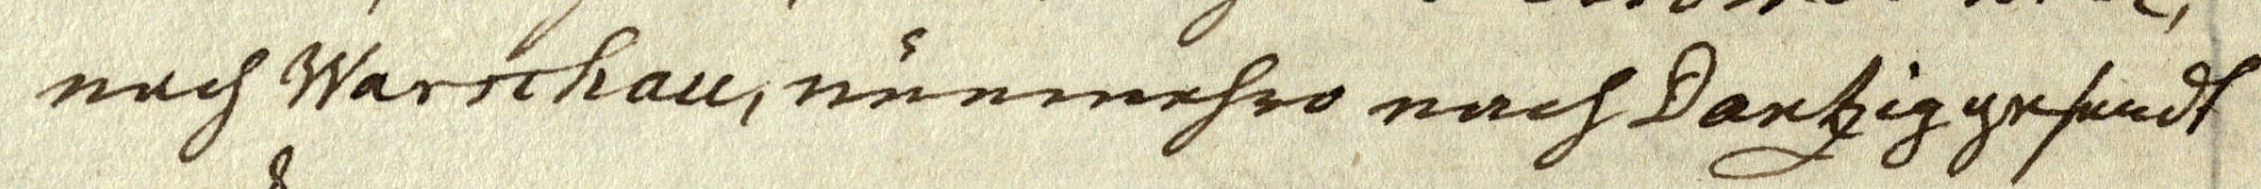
nach Warschau, nunmehro nach Dantzig gesandt
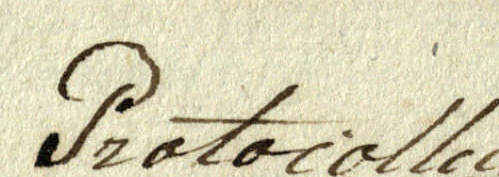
Protocollum.
